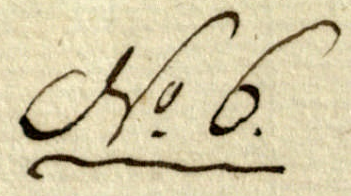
Nº 6.
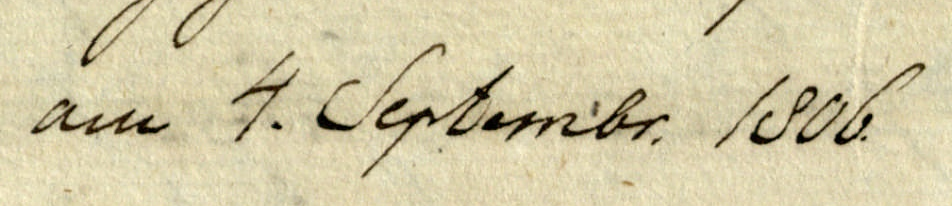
am 4. Septembr. 1806
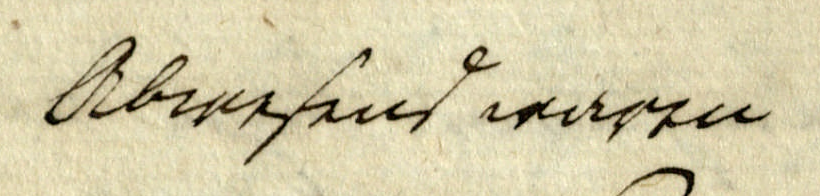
Abwesend waren
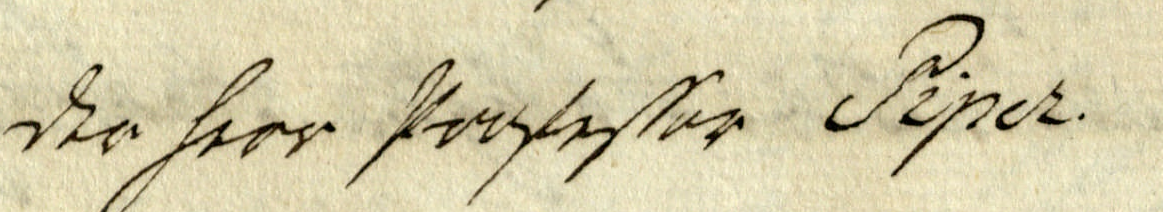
der herr Professor Piper.
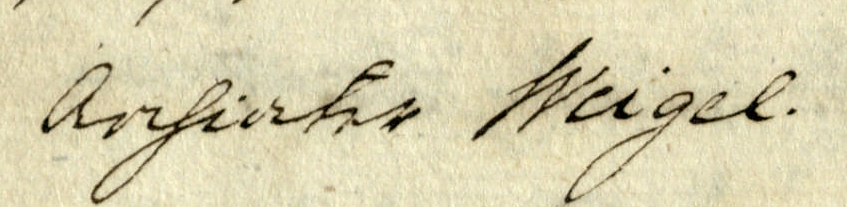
Archiater Weigel.
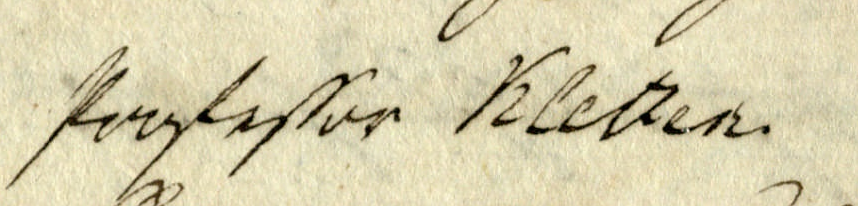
Prof. Kletten.
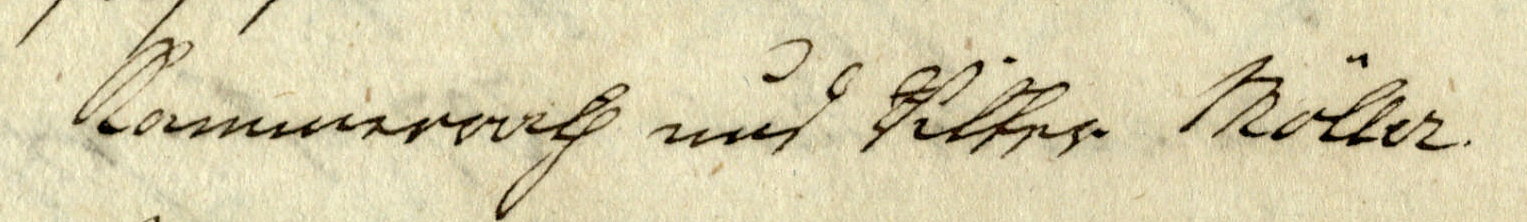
Kammerrath und Ritter Möller.
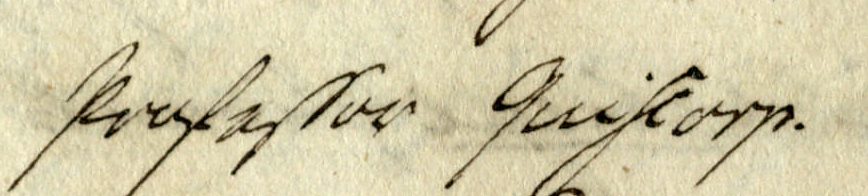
Professor Quistorp.
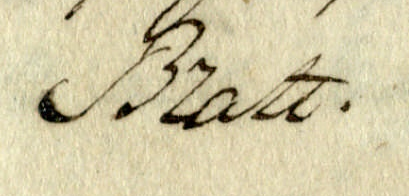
Bratt.
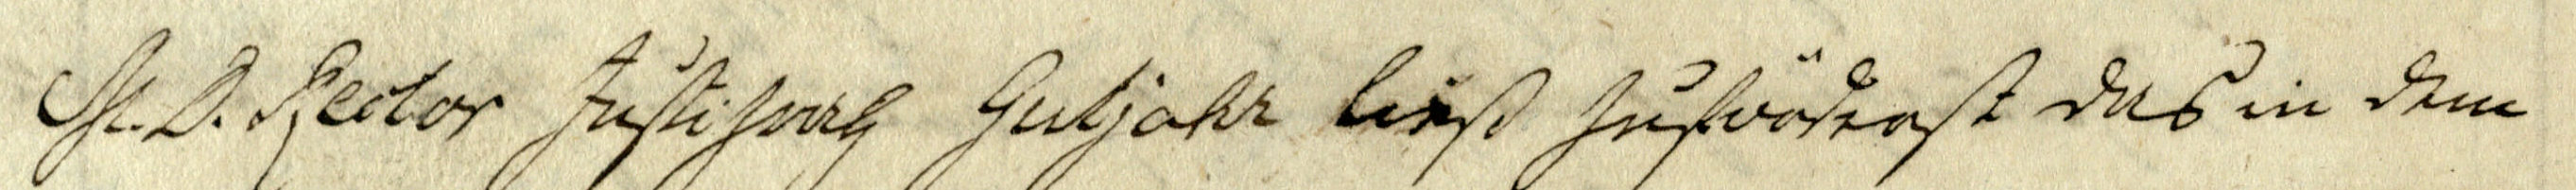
M. D. Rector Justizrath Gutjahr ließ zuförderst das in dem
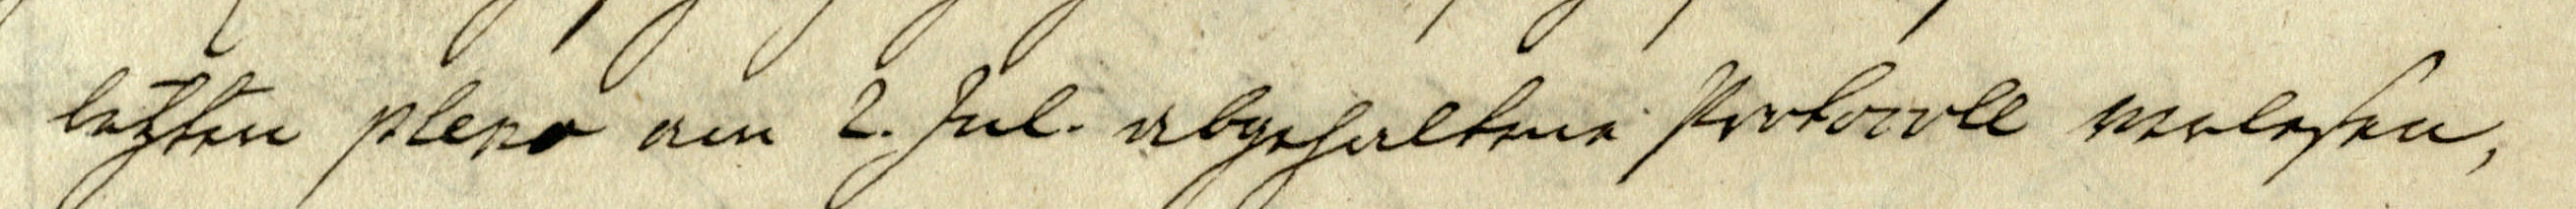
letzten pleno am 2. Jul. abgehaltene Protocoll verlesen,
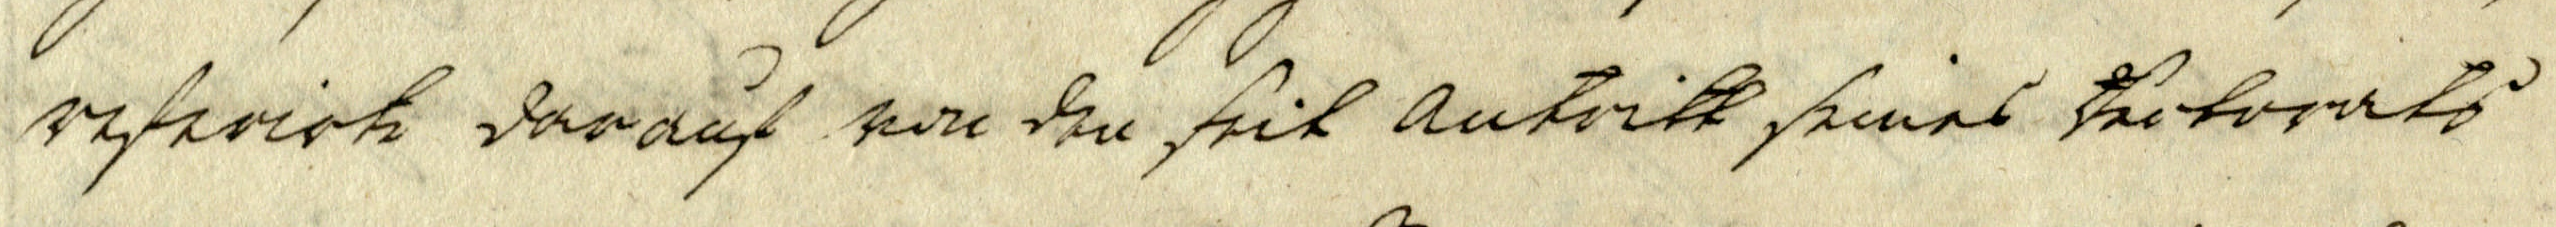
referirte darauf von den seit Antritt seines Rectorats
